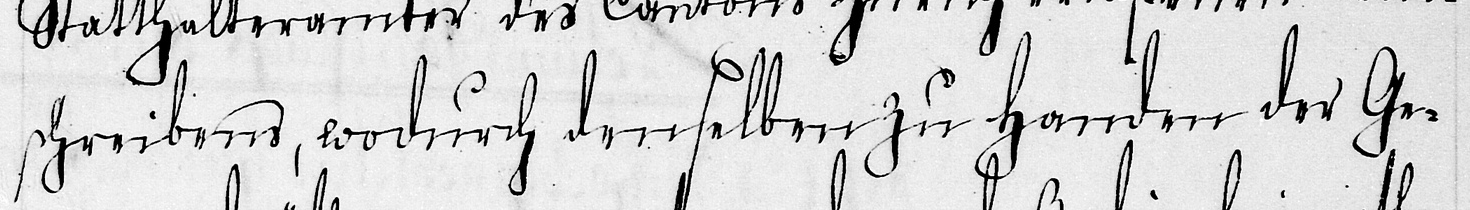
schreibens, wodurch denselben zu Handen der Ge¬
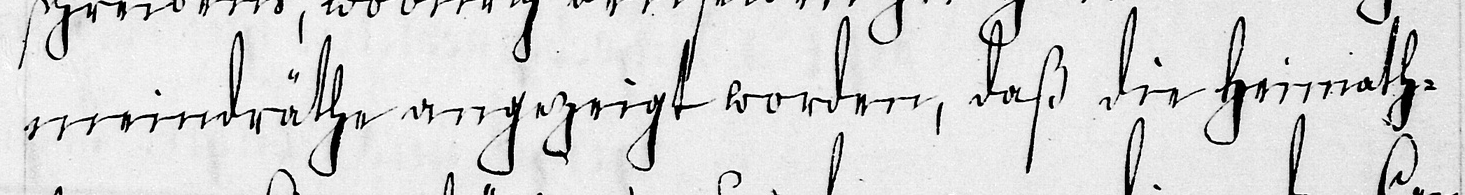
meindräthe angezeigt worden, daß die Heimaths¬
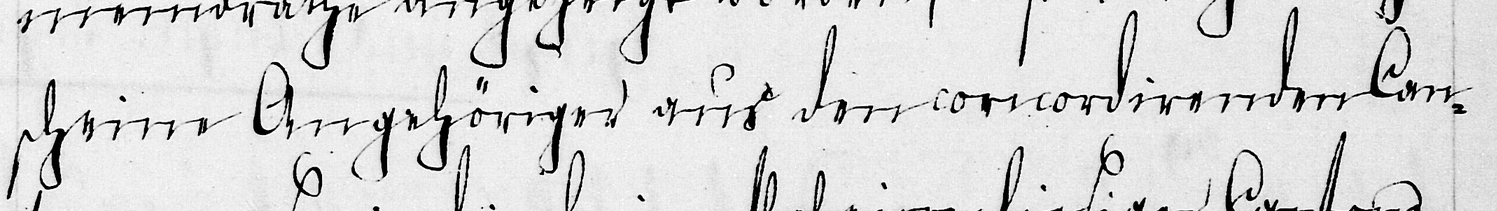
cheine Angehöriger aus den concordirenden Can¬
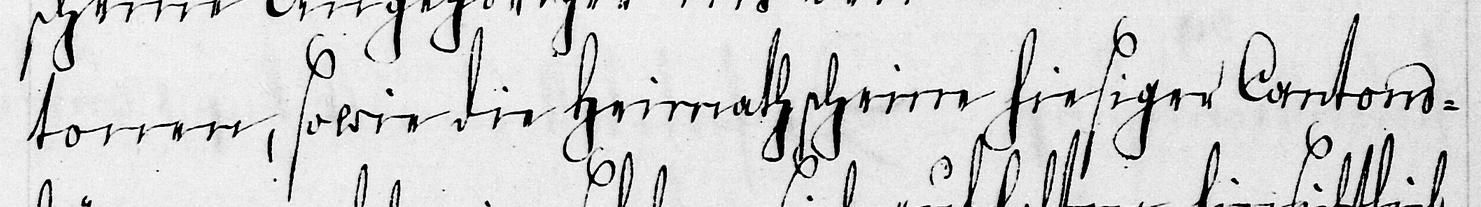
tonen, sowie die Heimathscheine hiesiger Cantons¬
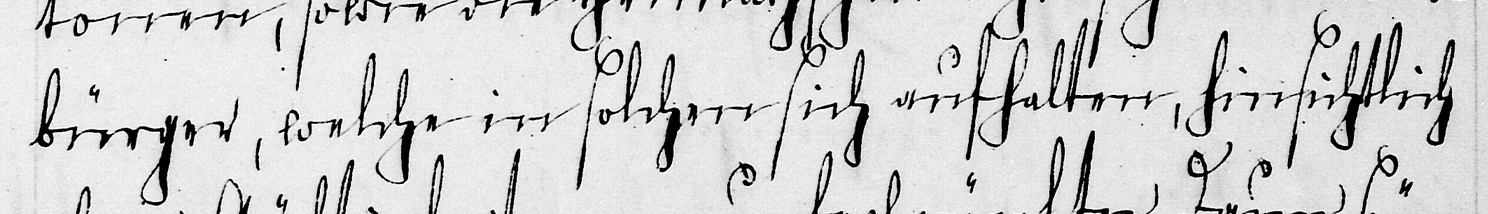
bürger, welche in solchen sich aufhalten, hinsichtlich
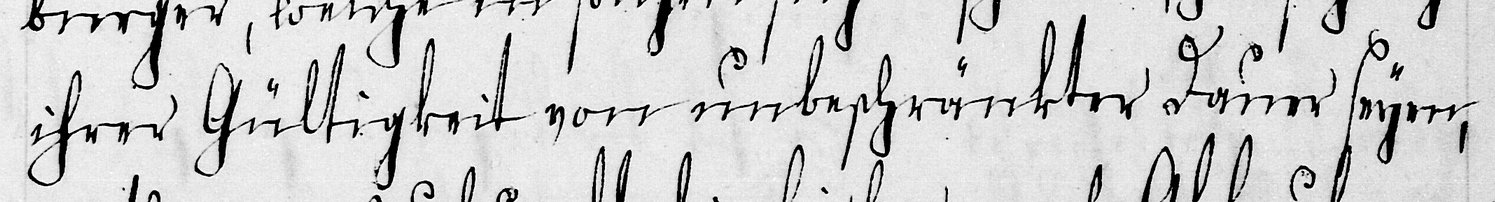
ihrer Gültigkeit von unbeschränkter Dauer seyen,
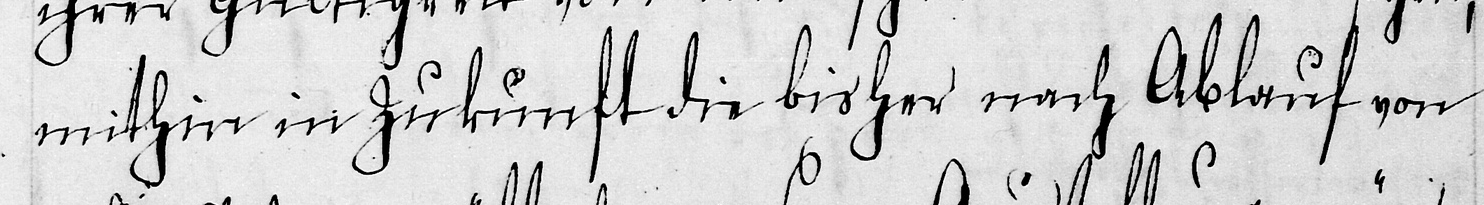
mithin in Zukunft die bisher nach Ablauf von
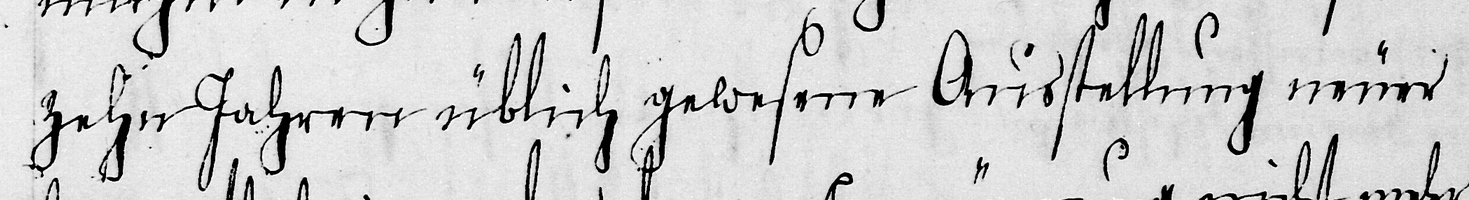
zehn Jahren üblich gewesene Ausstellung neuer
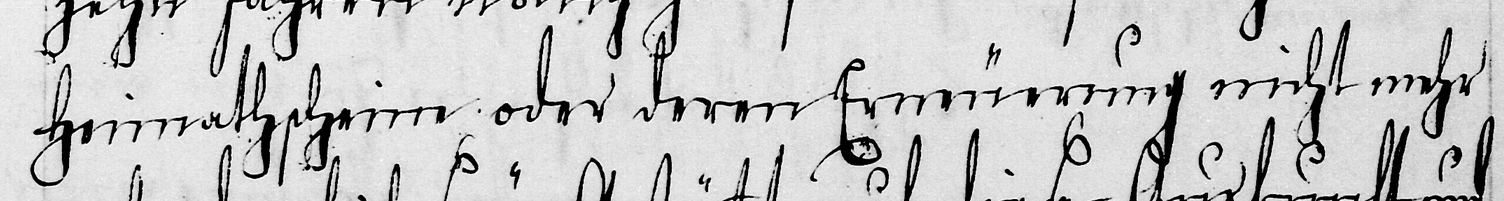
Heimathscheine oder deren Erneuerung nicht mehr
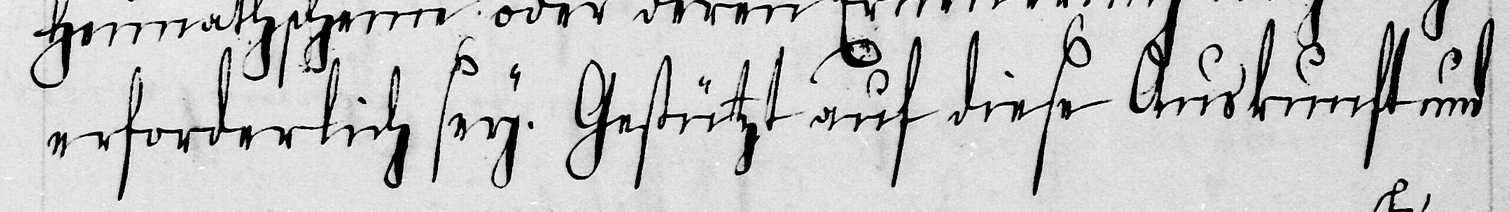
erforderlich sey. Gestützt auf diese Auskunft und
